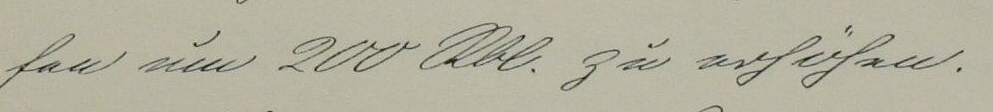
fen um 200 Rbl. zu erhöhen.
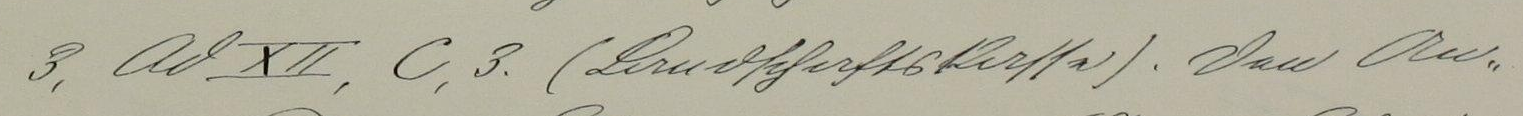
3. Ad XII. C,3. (Landschaftskasse). Den An-
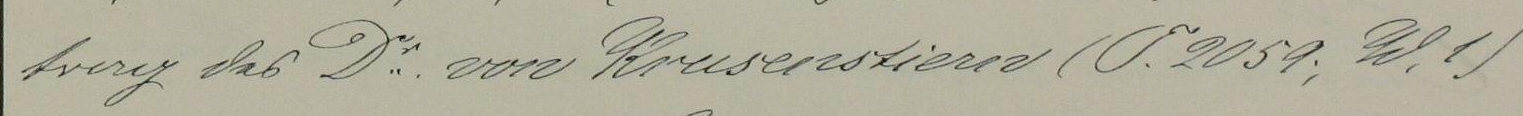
trag des Dr. von Krusenstiern (T.2059; W.1)
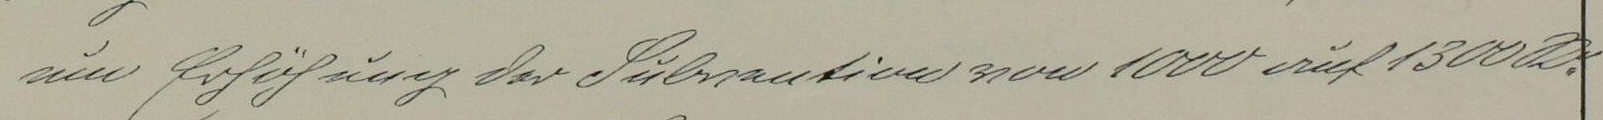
um Erhöhung der Subvention von 1000 auf 1300 Ro.
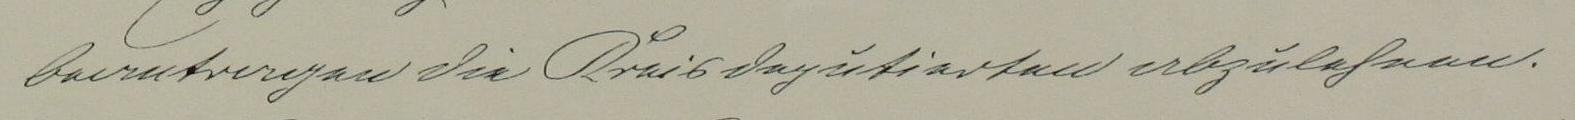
beantragen die Kreisdeputierten abzulehnen.
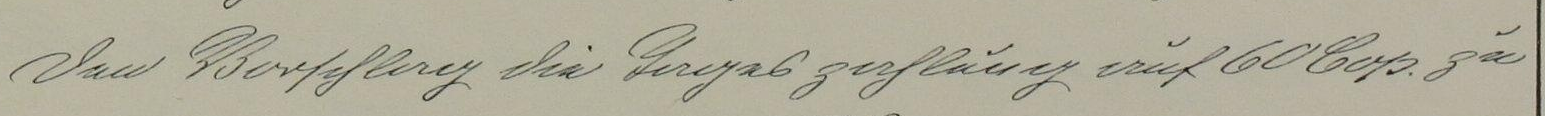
Dem Vorschlag die Tageszahlung auf 60 Cop. zu
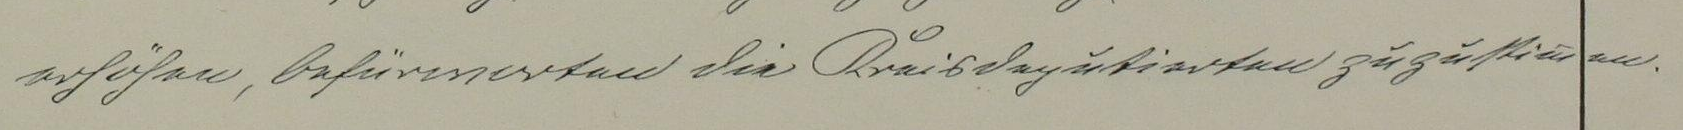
erhöhen, befürworten die Kreisdeputierten zuzustimmen.
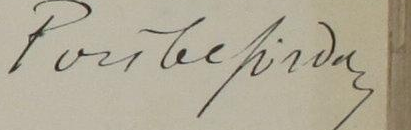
Postbehörden
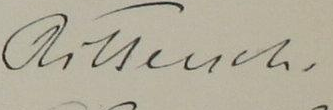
Rittersch.
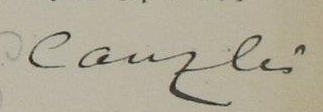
Canzlei
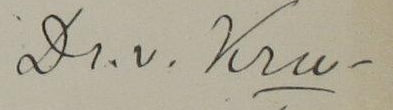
Dr. v. Kru-
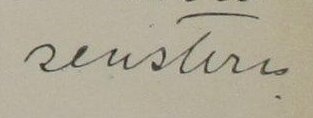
senstern
